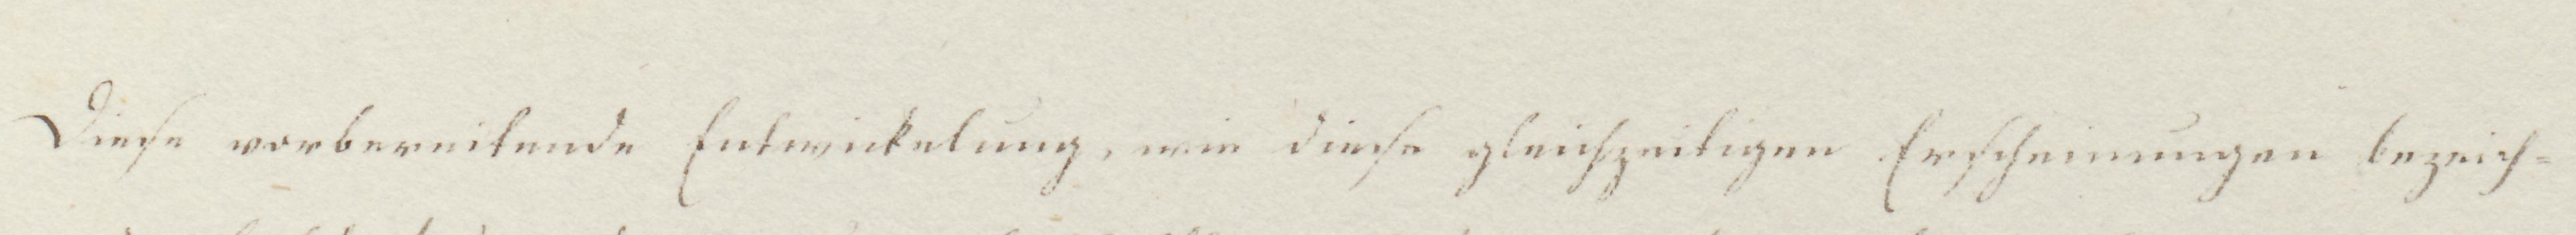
Diese vorbereitende Entwickelung, wie diese gleichzeitigen Erscheinungen bezeich-
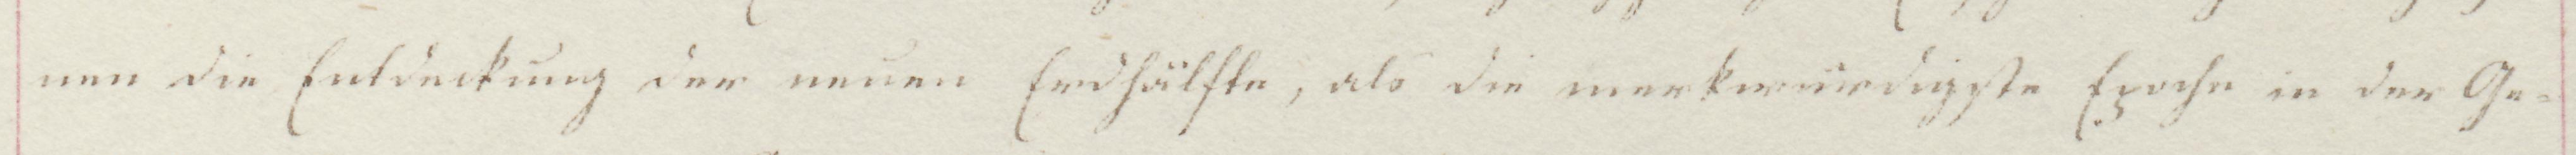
nen die Entdeckung der neuen Erdhälfte, als die merkwürdigste Epoche in der Ge-
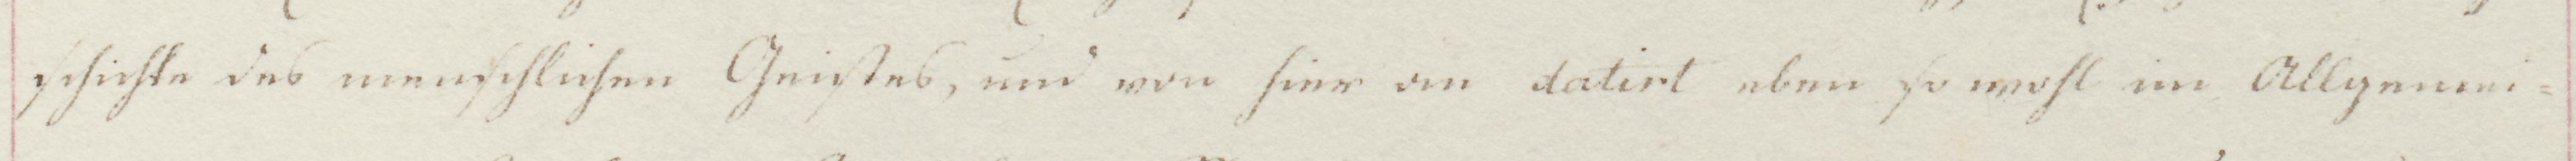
schichte des menschlichen Geistes, und von hier an datirt eben so wohl im Allgemei-
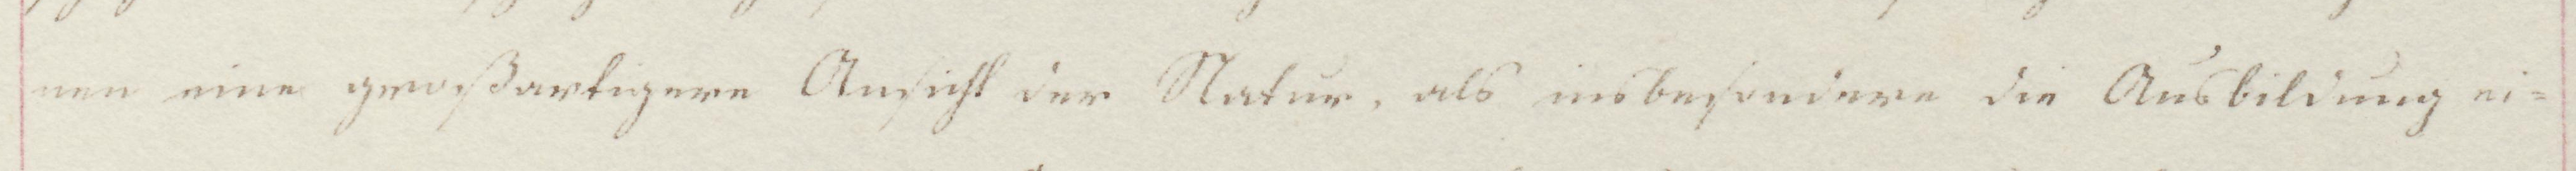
nen eine großartigere Ansicht der Natur, als insbesondere die Ausbildung ei-
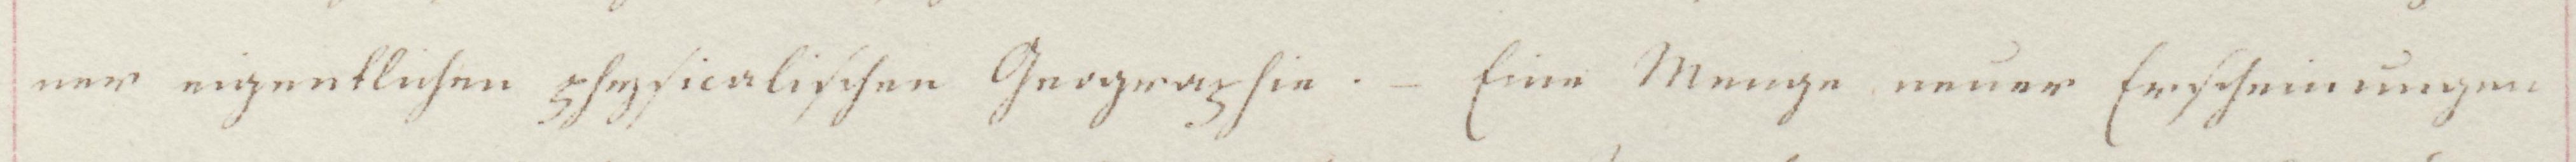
ner eigentlichen physicalischen Geographie. – Eine Menge neuer Erscheinungen
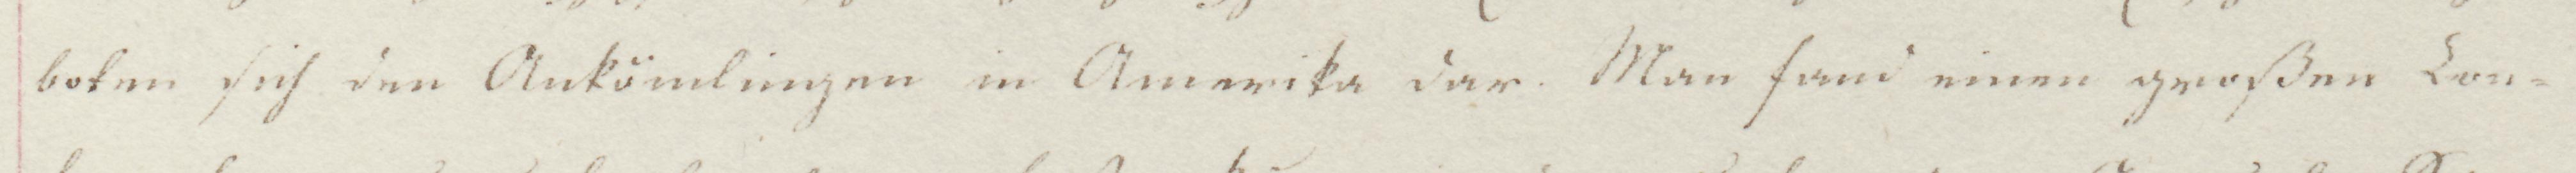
boten sich den Ankömlingen in Amerika dar. Man fand einen großen Con-
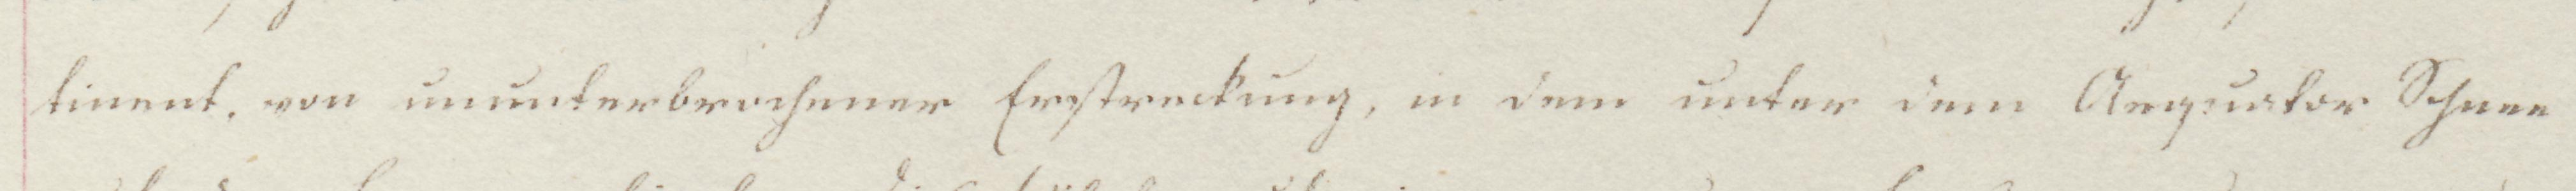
tinent, von ununterbrochener Erstreckung, in dem unter dem Aequator Schnee
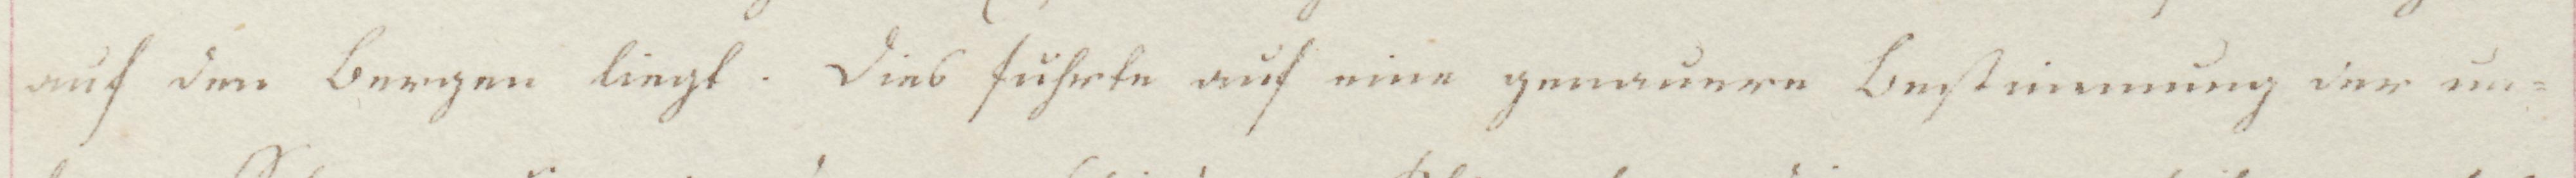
auf den Bergen liegt. Dies führte auf eine genauere Bestimmung der un-
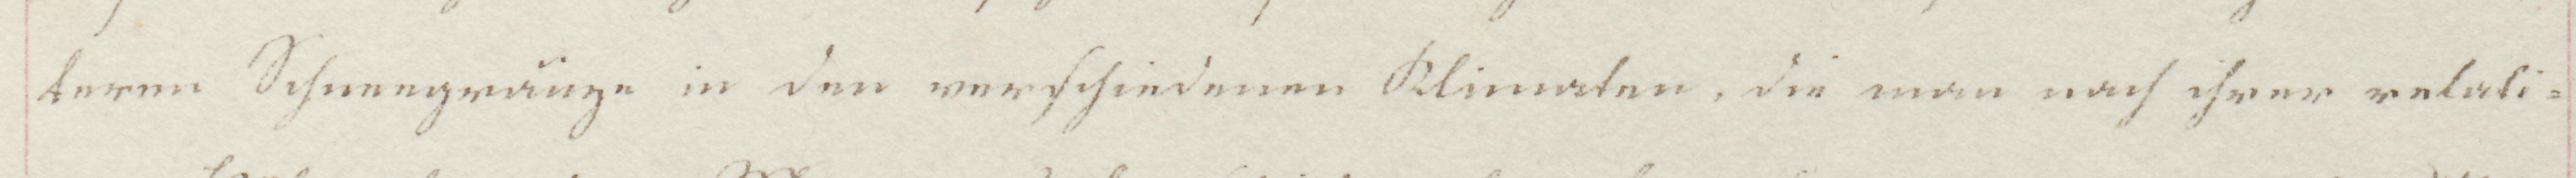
teren Schneegränze in den verschiedenen Klimaten, die man nach ihrer relati-
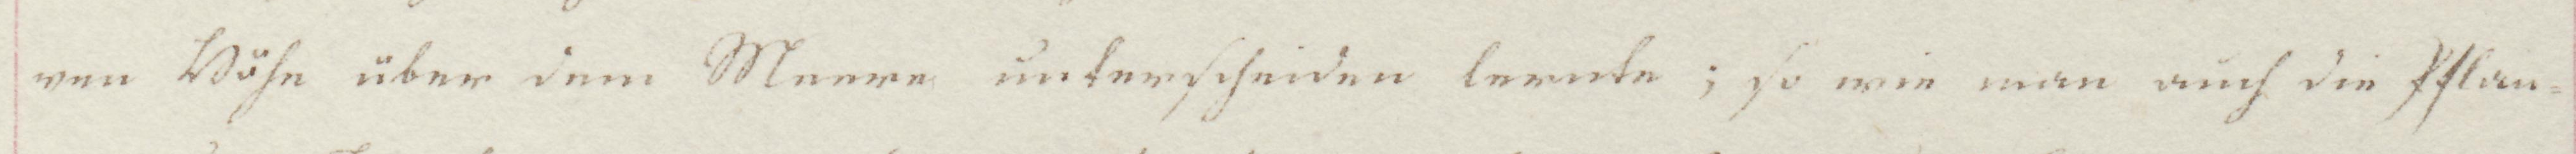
ven Höhe über dem Meere unterscheiden lernte; so wie man auch die Pflan-
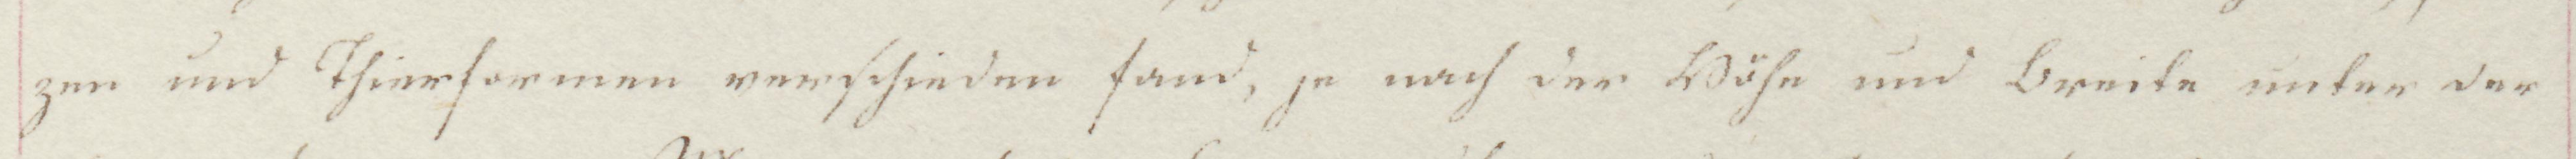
zen und Thierformen verschieden fand, je nach der Höhe und Breite unter der
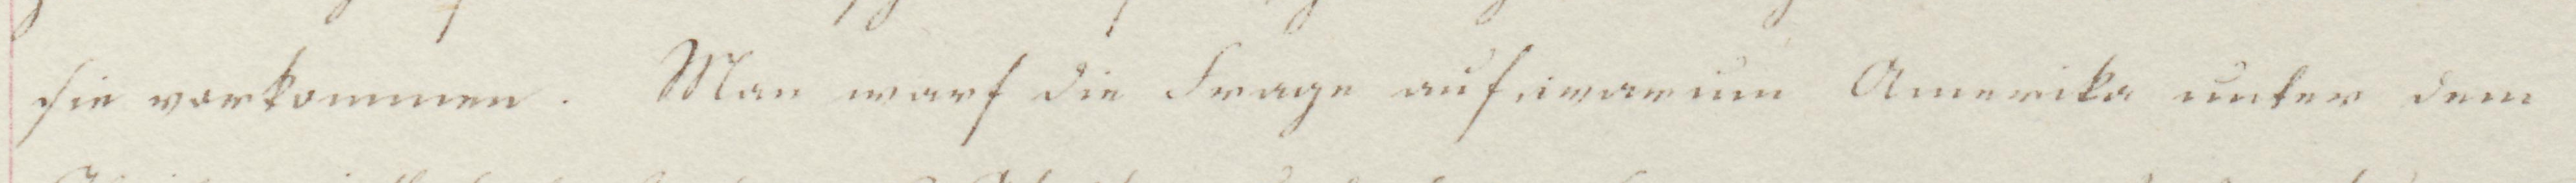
sie vorkommen. Man warf die Frage auf, warum Amerika unter dem
